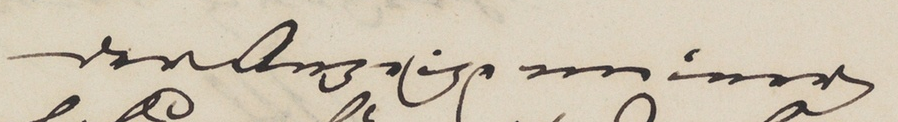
Der Anzeige meiner
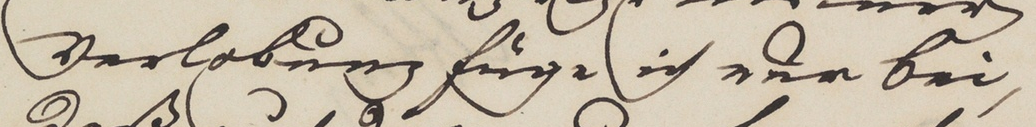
Verlobung füge ich nur bei,
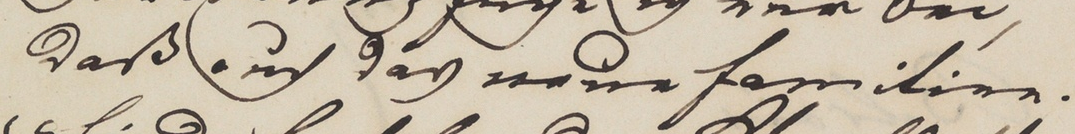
daß auch das neue Familien-
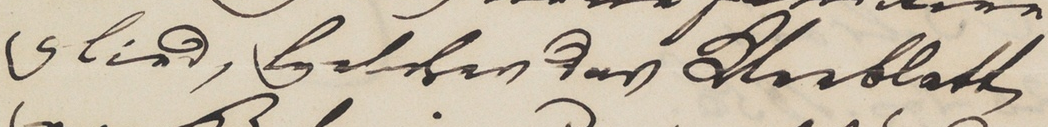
glied, welches das Kleeblatt
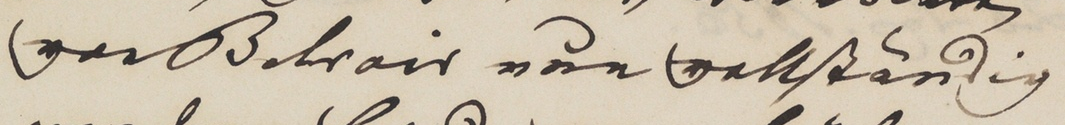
von Belvoir nun vollständig
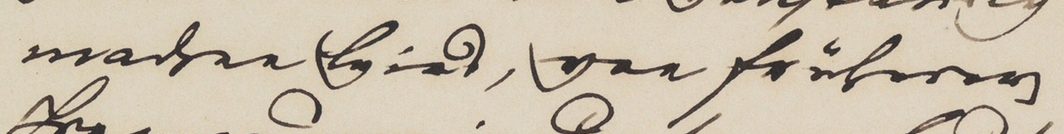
machen wird, von früherer
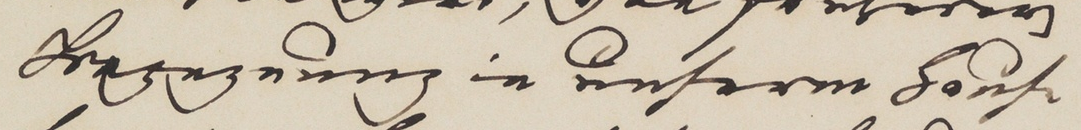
Begegnung in unserm Hause
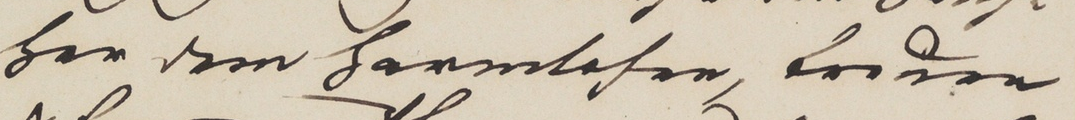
her dem harmlosen, treuen
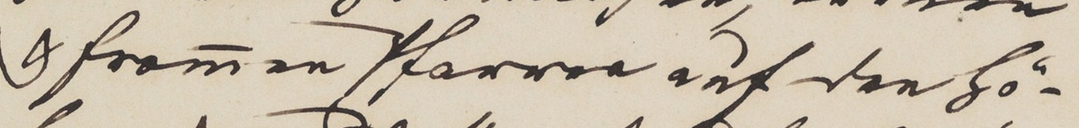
& frommen Pfarrer auf den Hö-
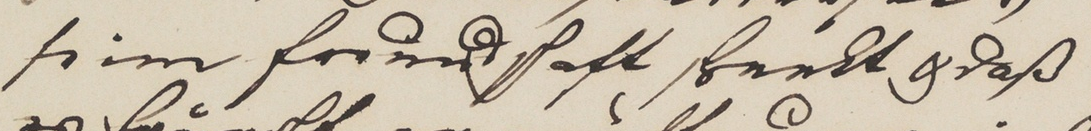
seine Freundschaft schenkt & daß
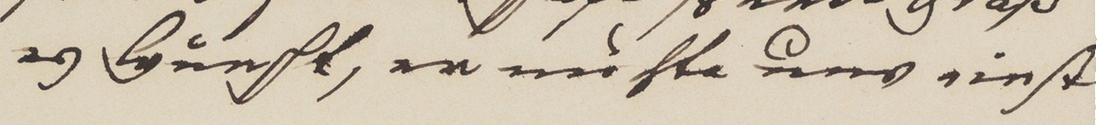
es wünscht, er möchte uns einst
